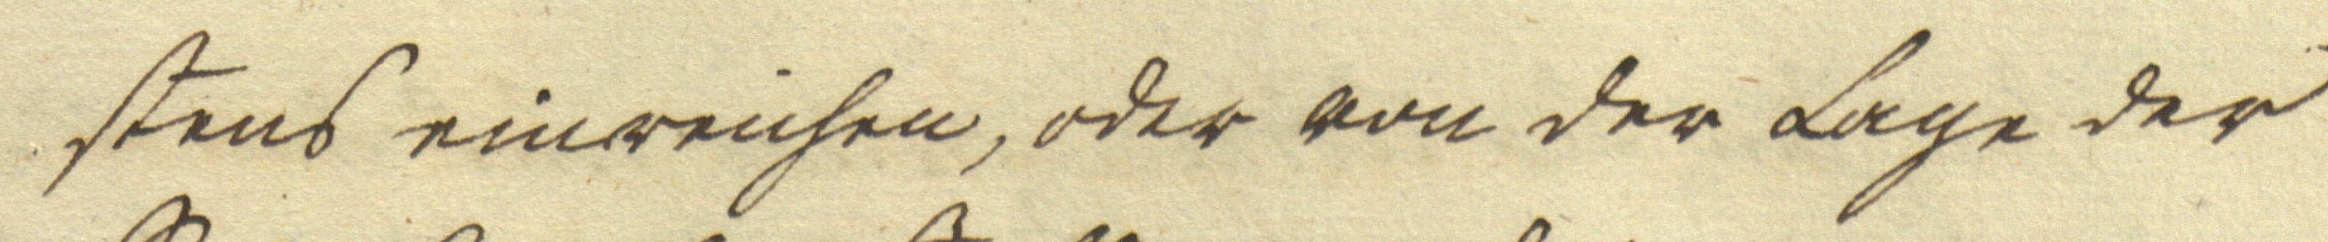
stens einreichen, oder von der Lage der
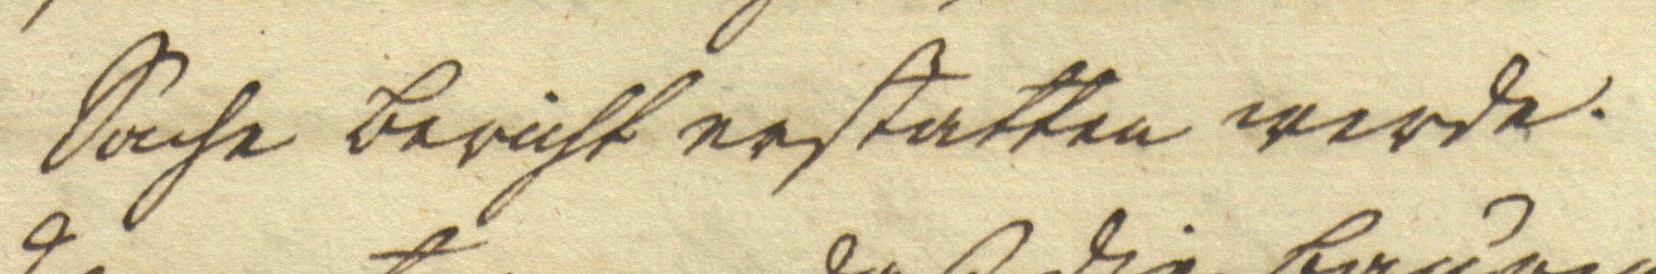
Sache Bericht erstatten werde.
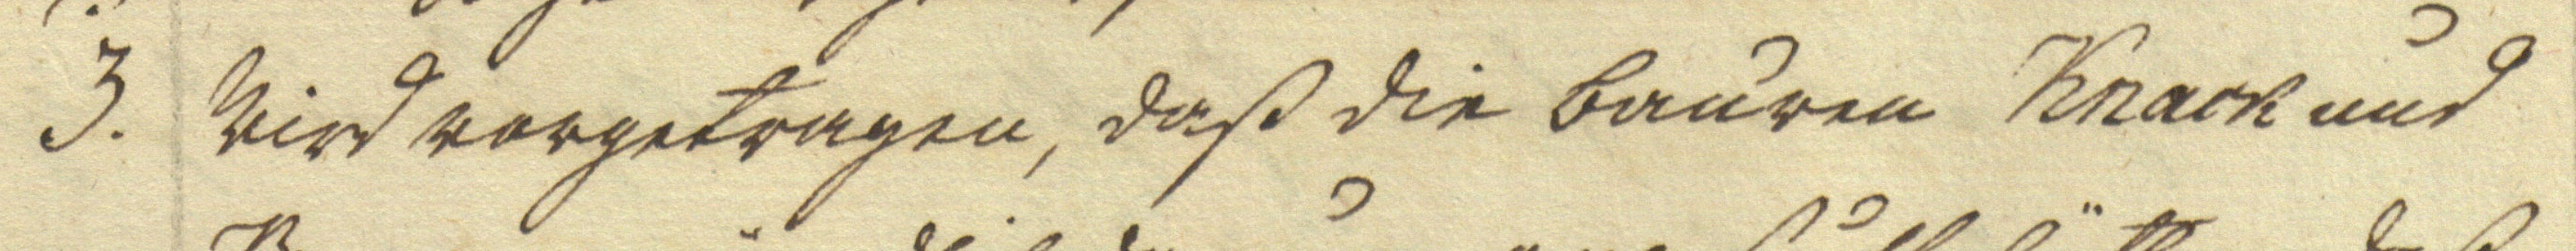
3. Wird vorgetragen, daß die Bauren Knack und
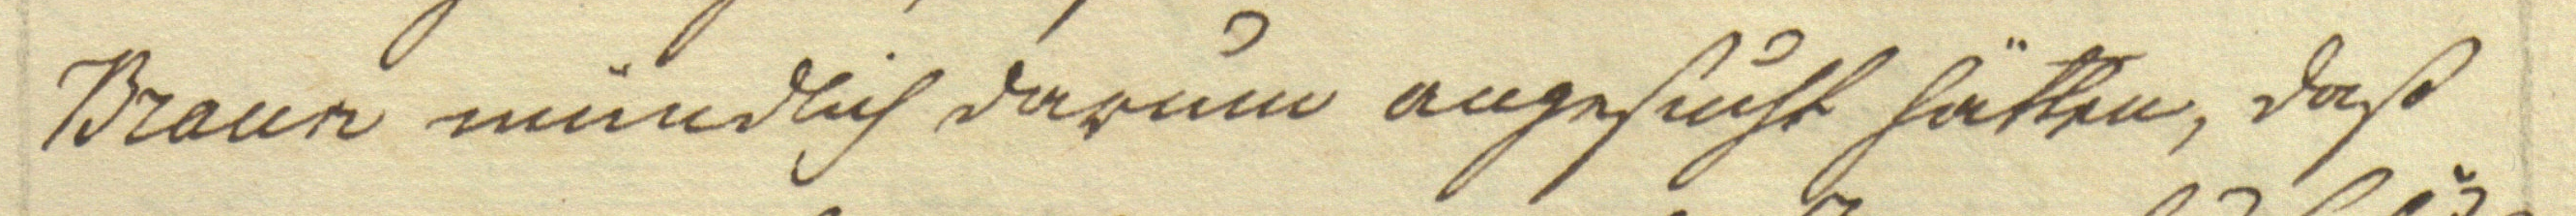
Braun mündlich darum angesucht hätten, daß
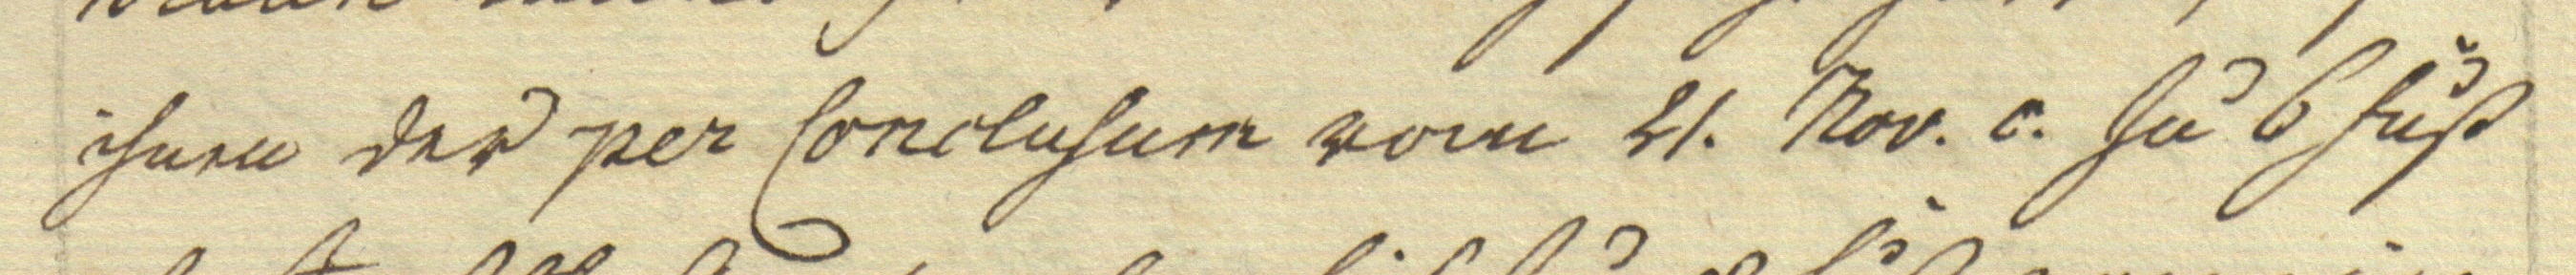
ihnen der per Conclusum vom 21. Nov. c. zu 6 Fuß
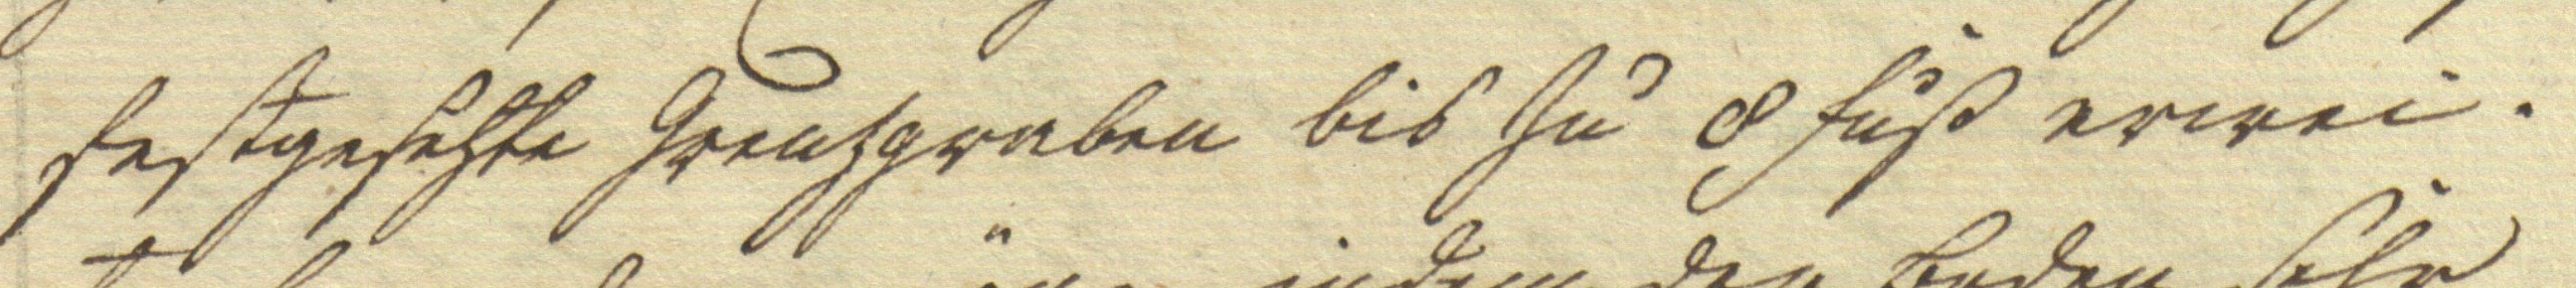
festgesetzte Grenzgraben bis zu 8 Fuß erwei¬
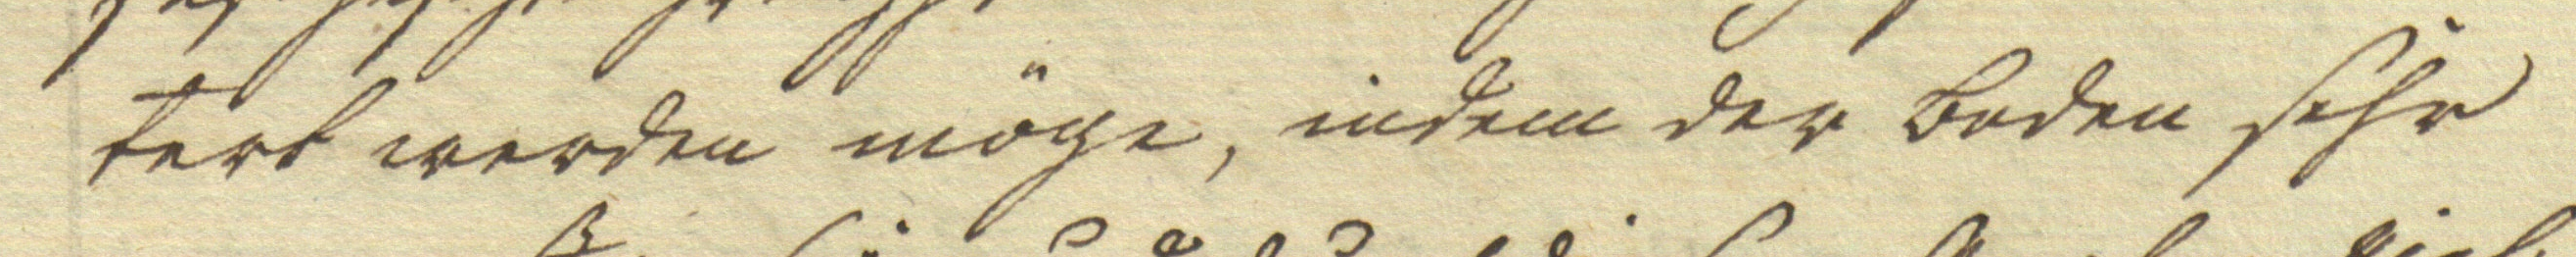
ert werden möge, indem der Boden sehr
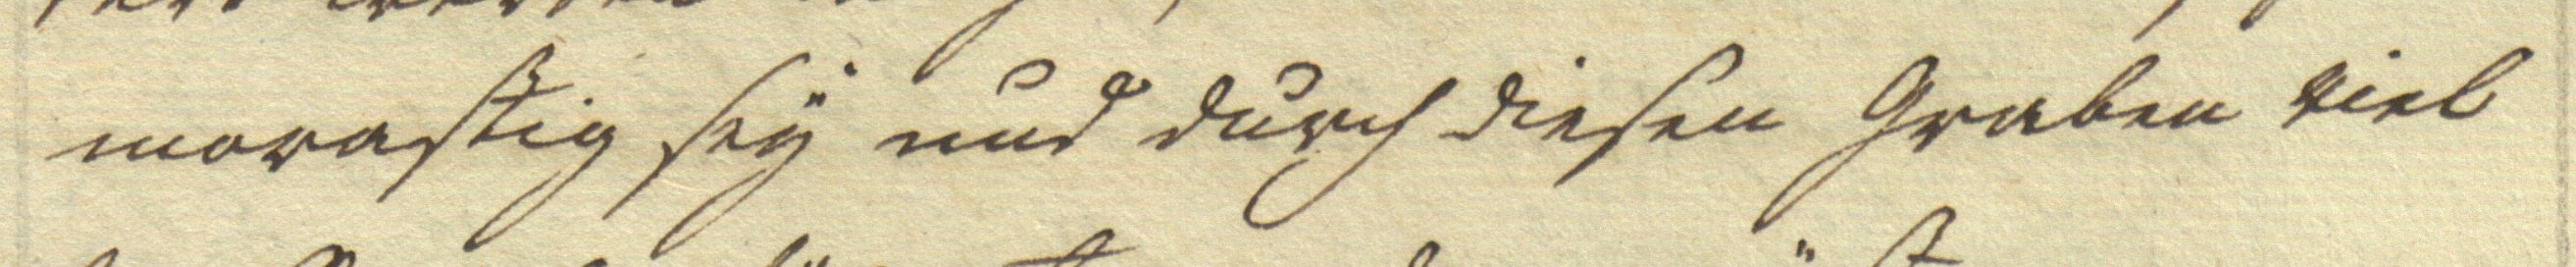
morastig seÿ und durch diesen Graben viel
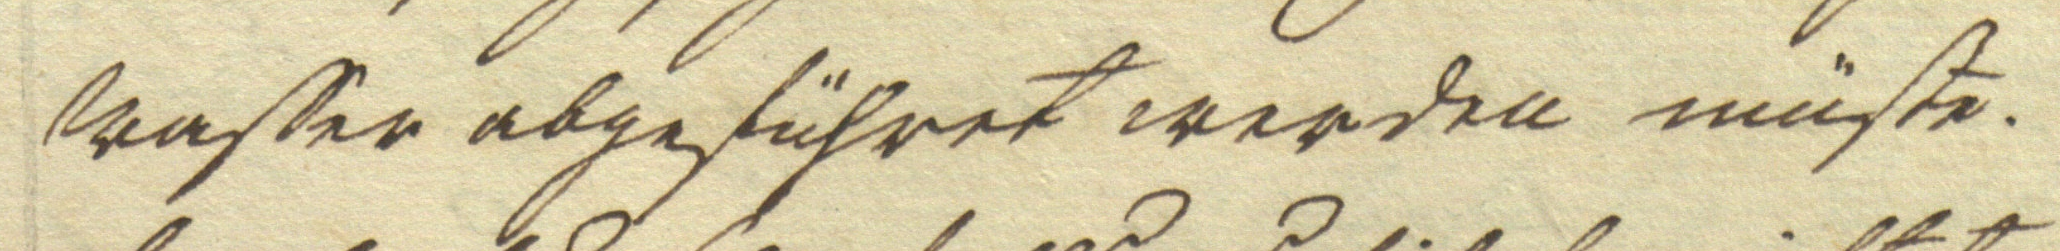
Wasser abgeführet werden müßte.
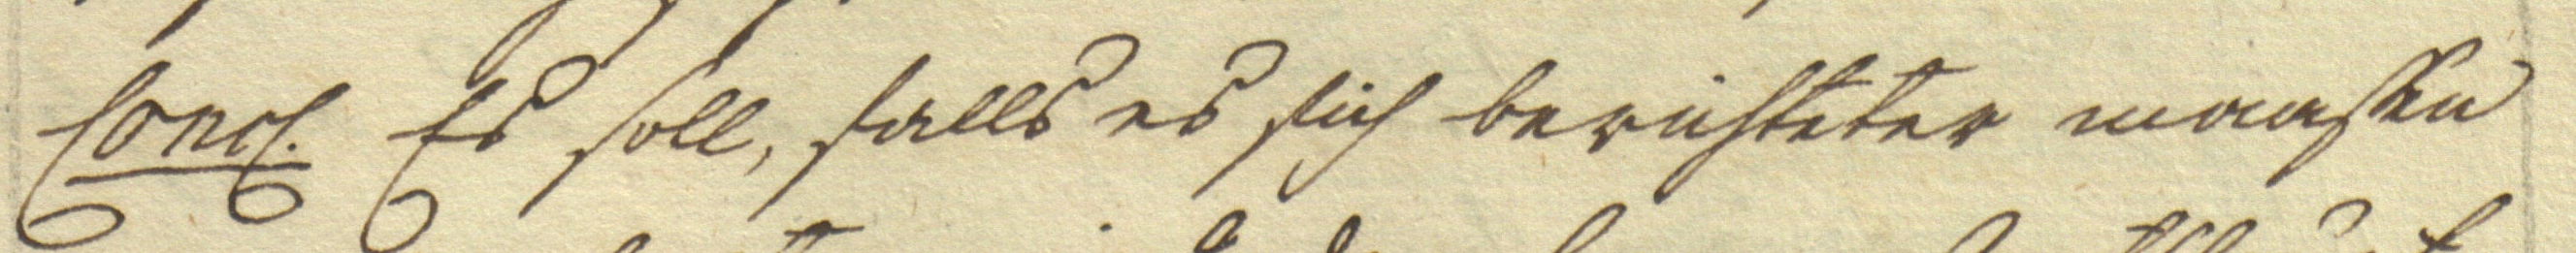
Concl. Es soll, falls es sich berichteter maassen
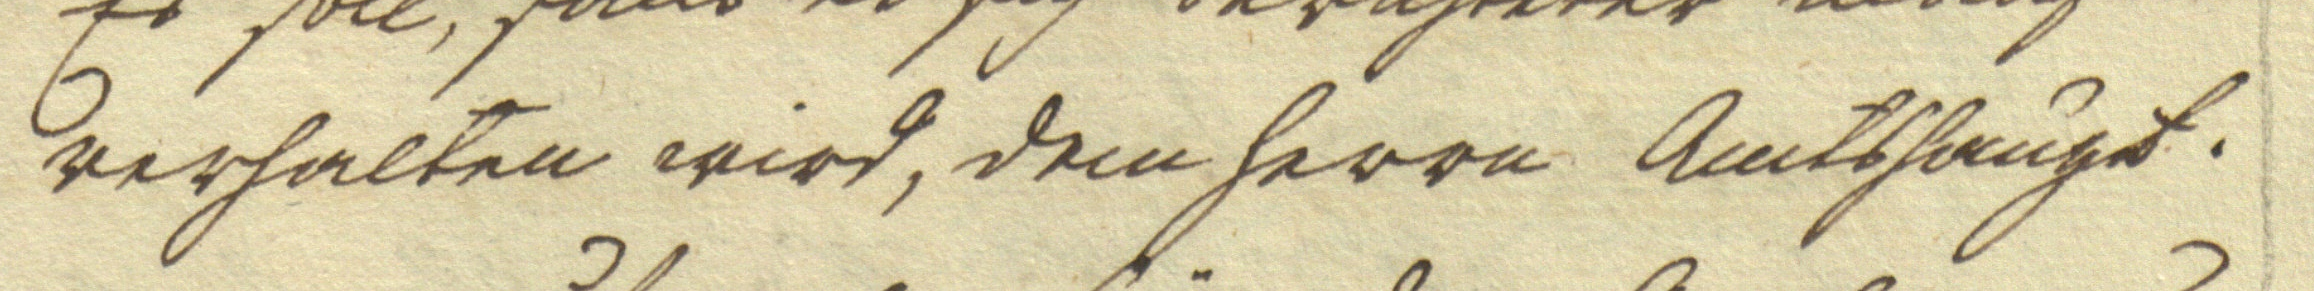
verhalten wird, dem Herrn Amtshaupt¬
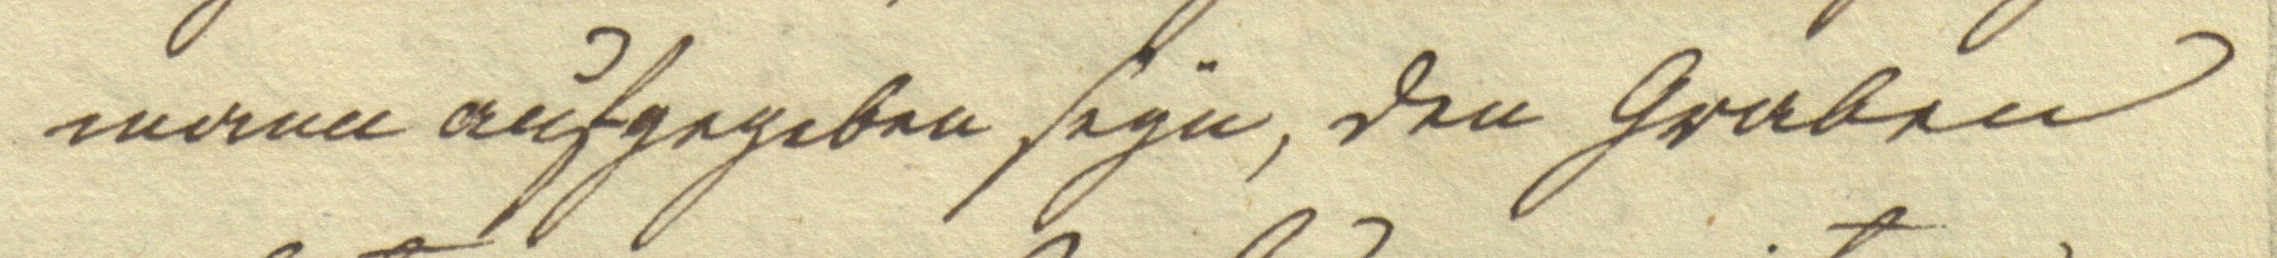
mann aufgegeben seÿn, den Graben
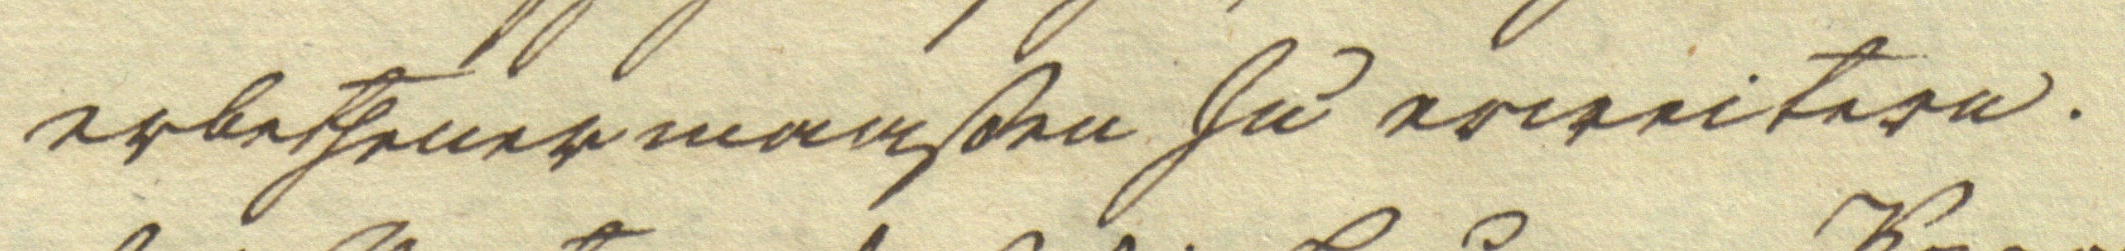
erbethenermaaßen zu erweitern.
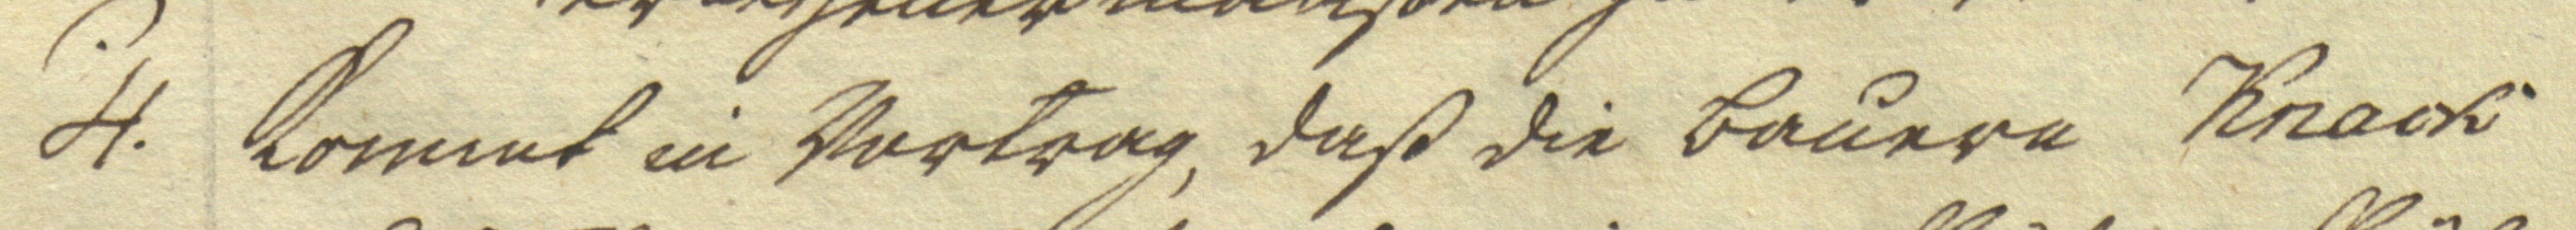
4. Kommt in Vortrag, daß die Bauern Knack
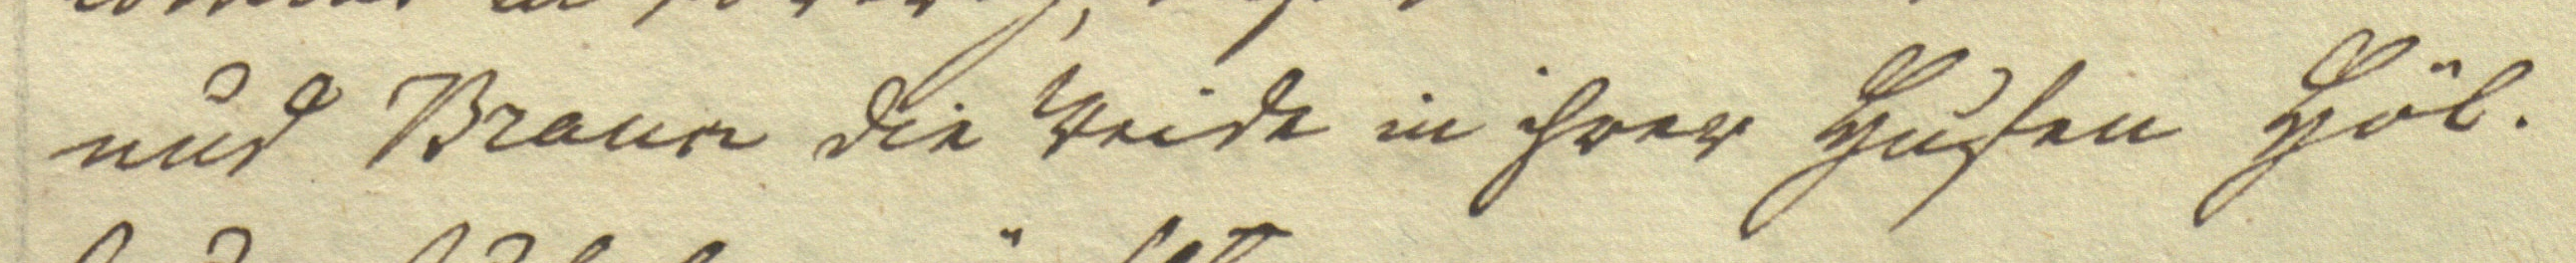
und Braun die Weide in iher Hufen Höl¬
